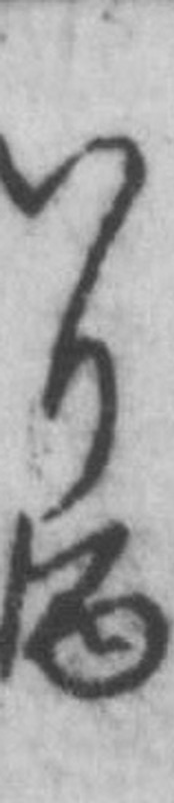はり酒
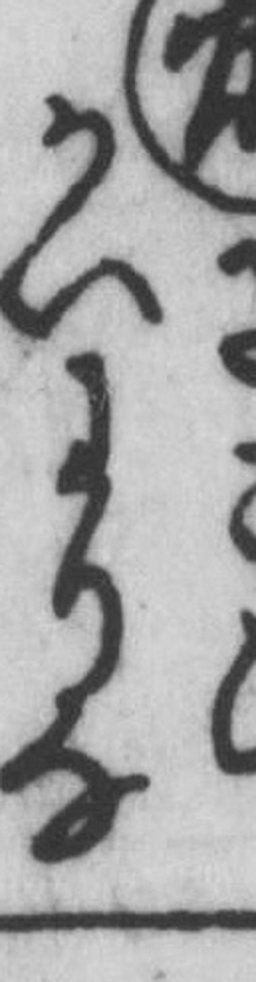かいわりな
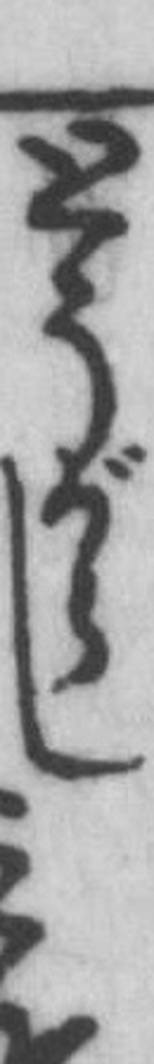とうからし
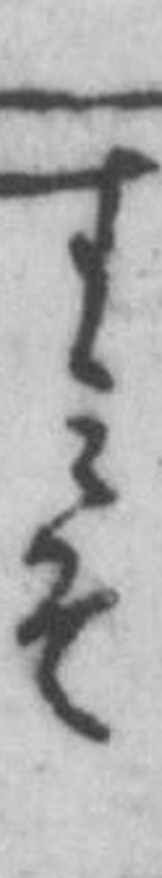すミそ
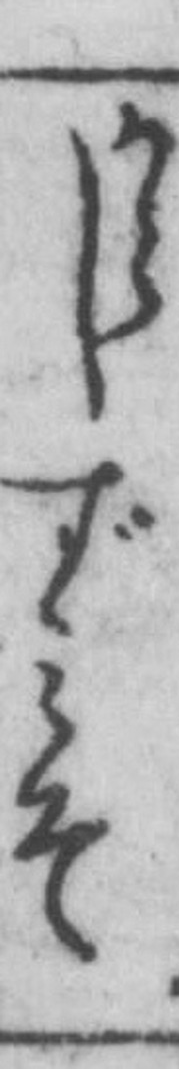からしずミそ
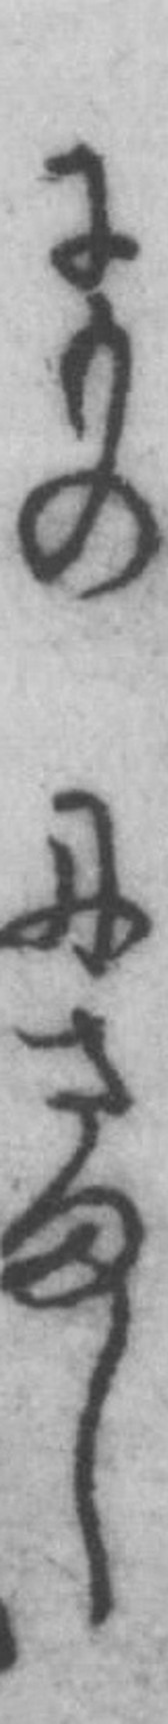にものにさまし
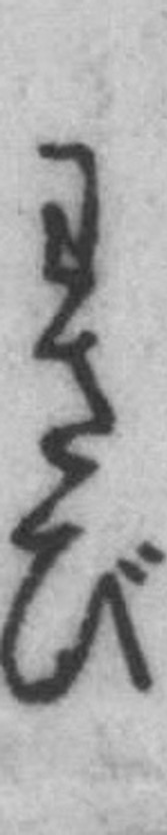わさび
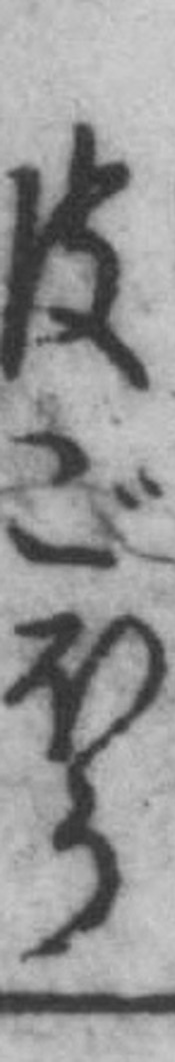皮ごぼう
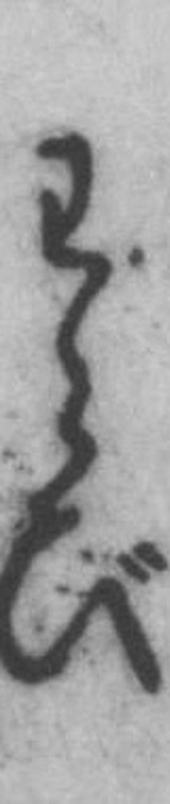わさび
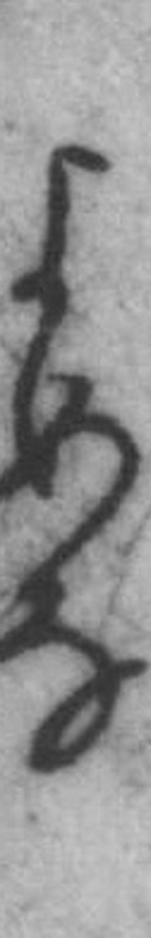よめな
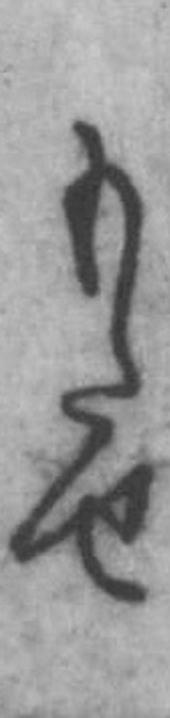もたせ

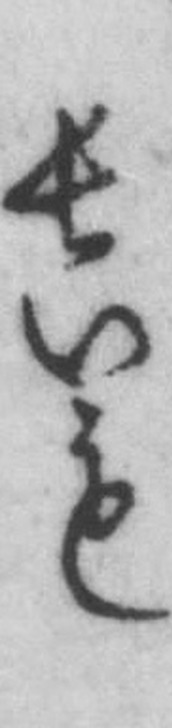長いも
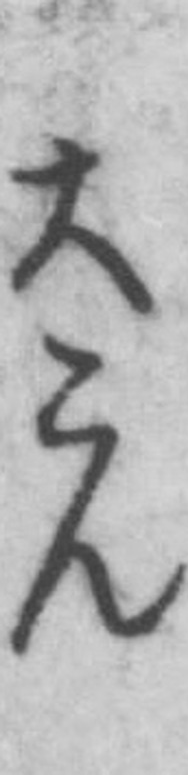大こん
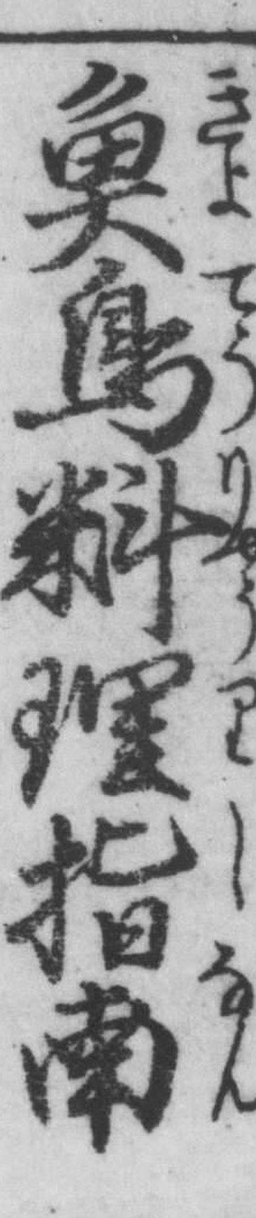魚島料理指南
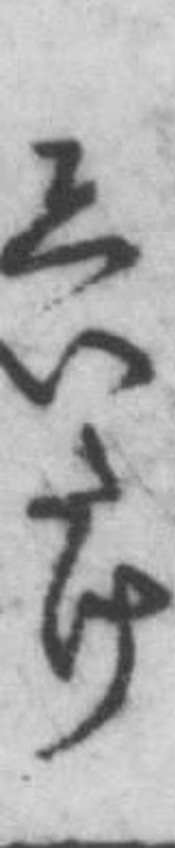しいたけ
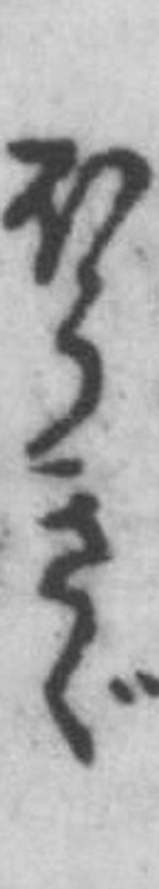ほうきゞ
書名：料理献立抄
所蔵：大阪府立大学学術情報センター 国文学研究資料館
